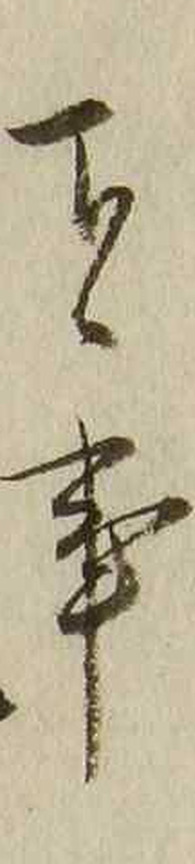下候事
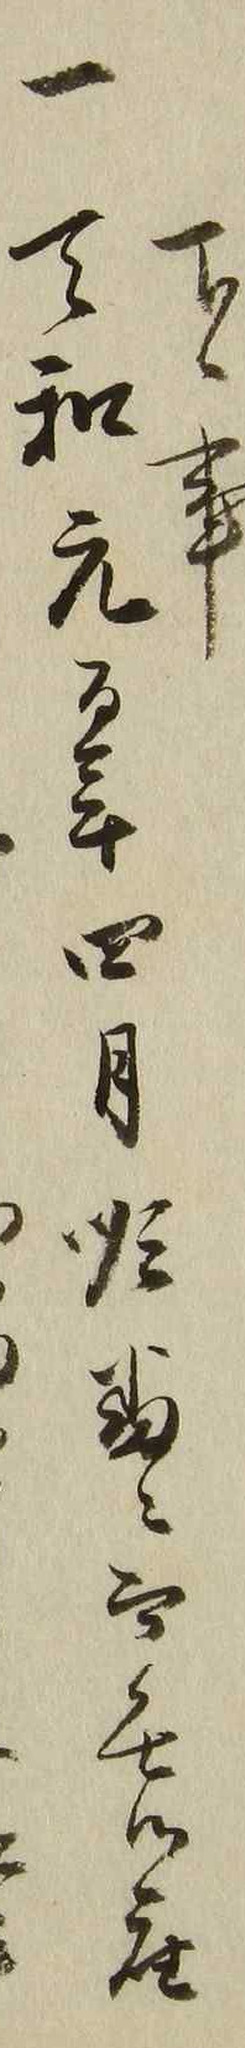一天和元酉年四月順番ニ而無御座
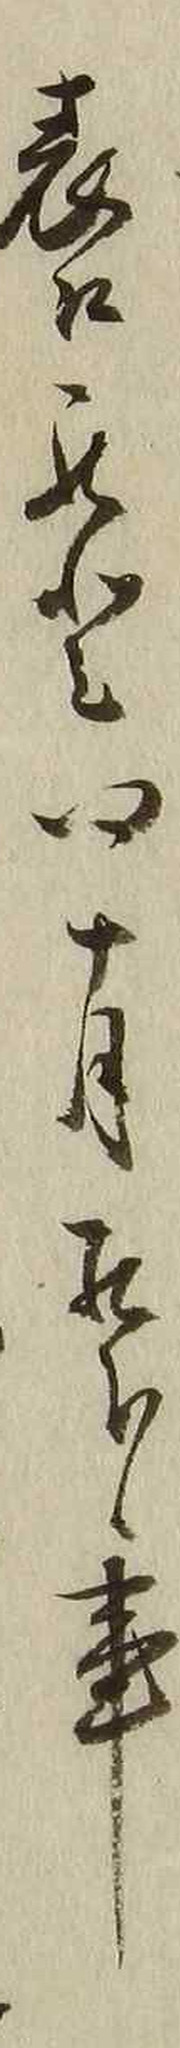表江罷登同十月罷下候事
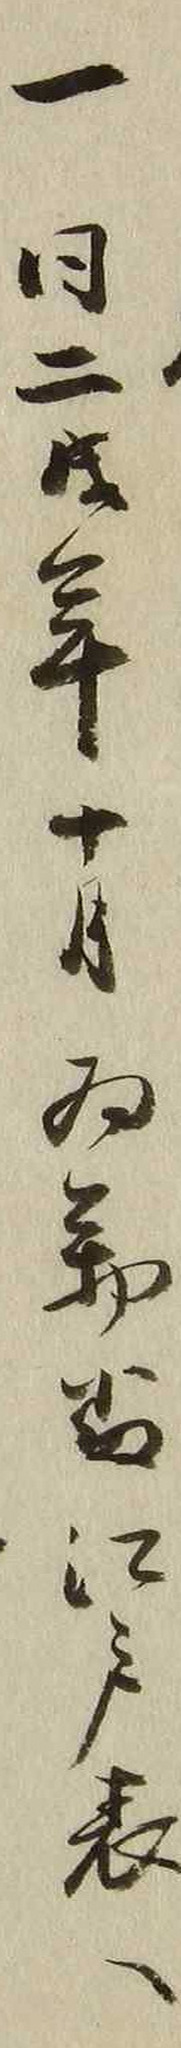一同二戌年十月為勤番江戸表へ
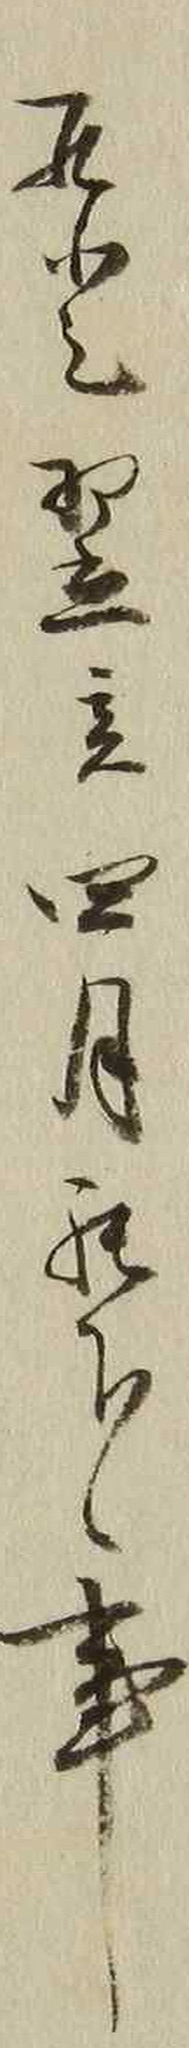罷登翌亥四月罷下候事
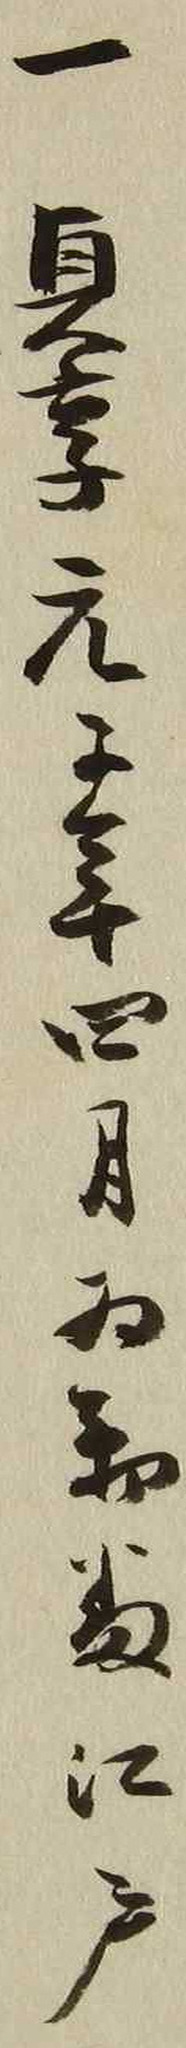一貞享元子年四月為勤番江戸
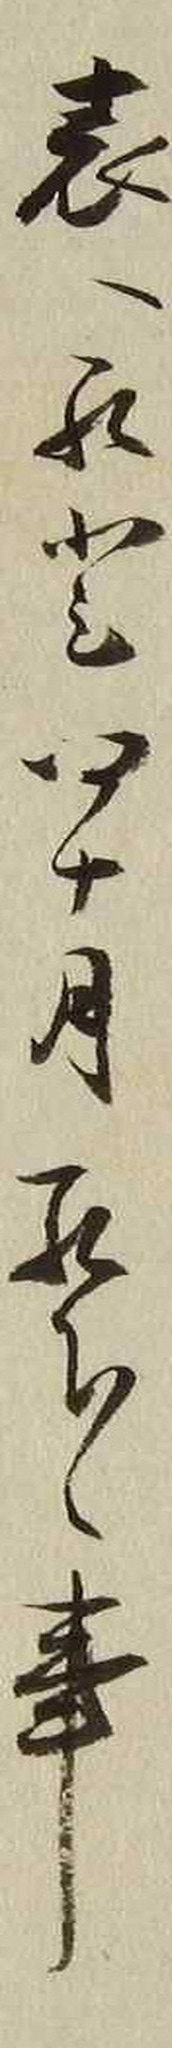表へ罷登同十月罷下候事
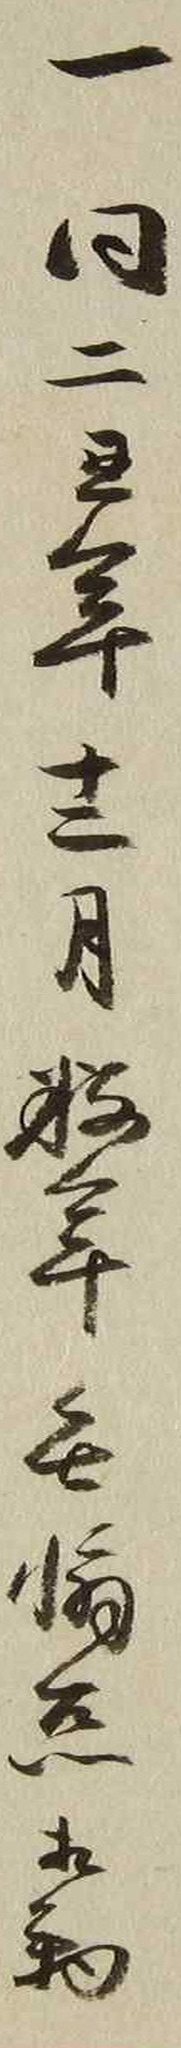一同二丑年十二月数年無懈怠相勤
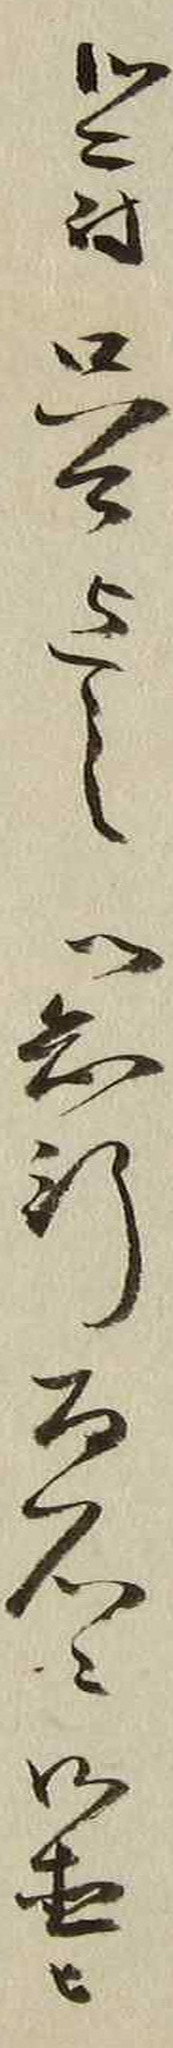候ニ付只今迄之御知行百石ニ御直被
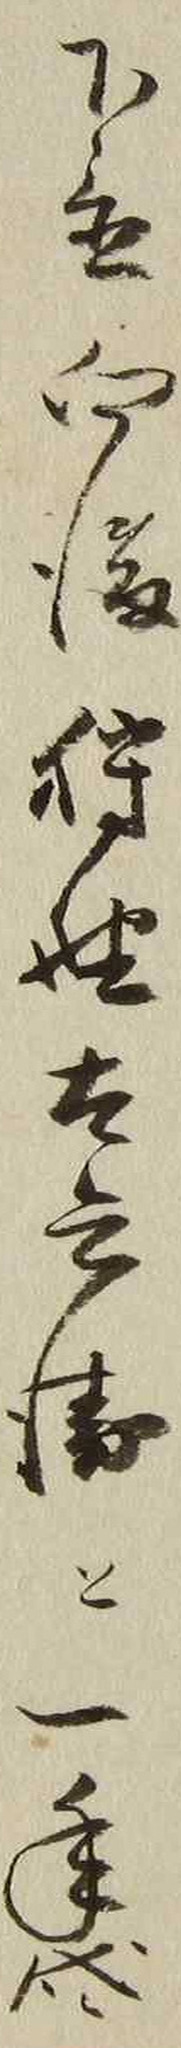下置向後狩野太兵衛と一年代
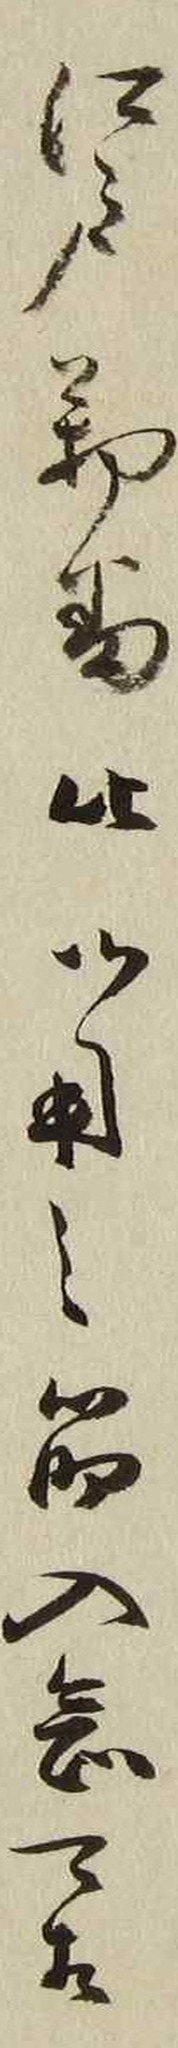江戸勤番仕御用之筋入念可相
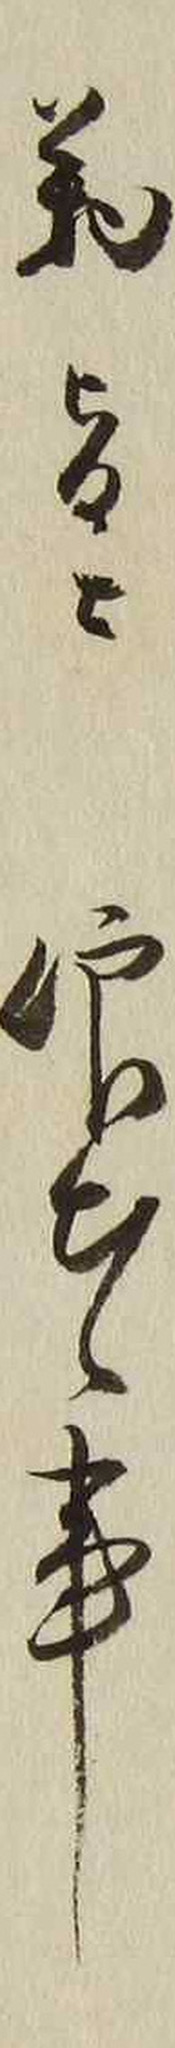勤旨被仰出候事
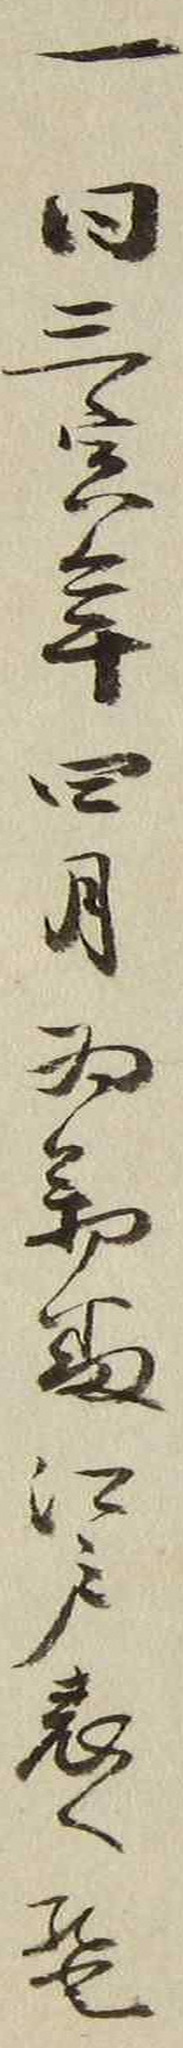一同三寅年四月為勤番江戸表へ罷登
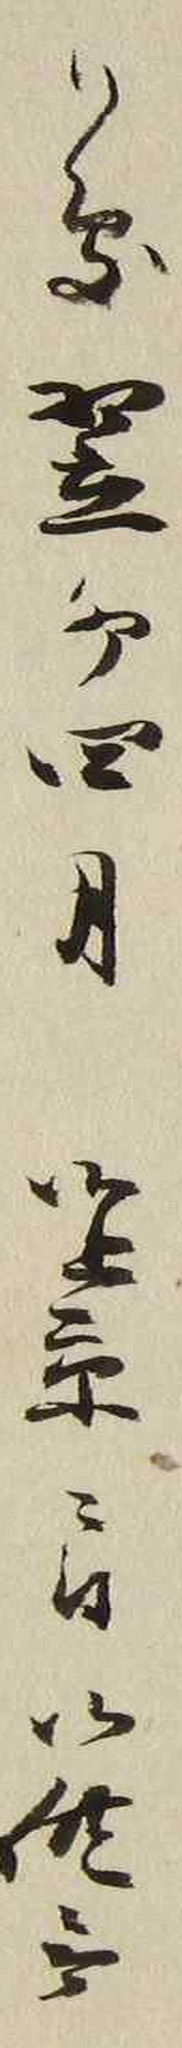候処翌卯四月御上京ニ付御供ニ而
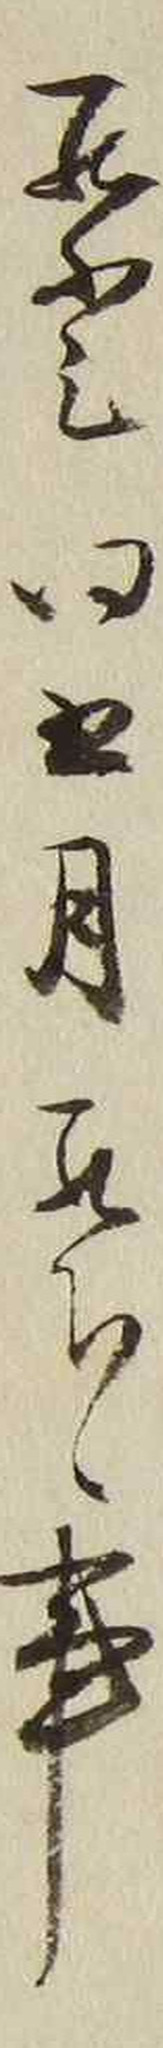罷登同五月罷下候事
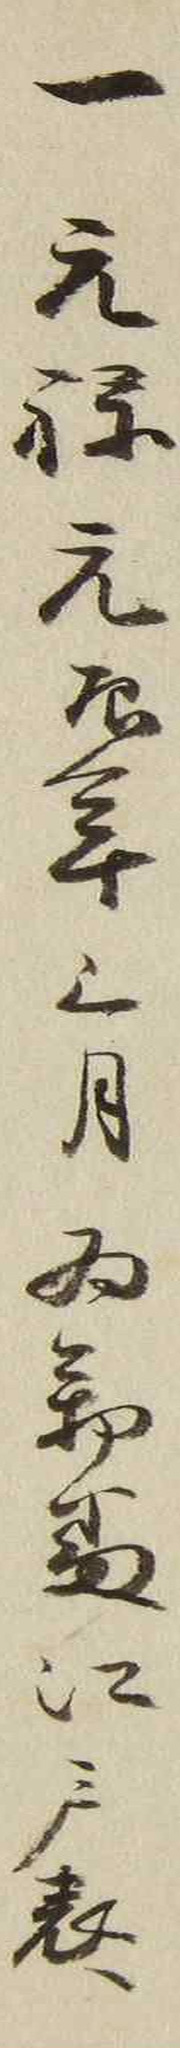一元禄元辰年三月為勤番江戸表へ
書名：諸士系譜　巻之288　さ之部20
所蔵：会津若松市立会津図書館
